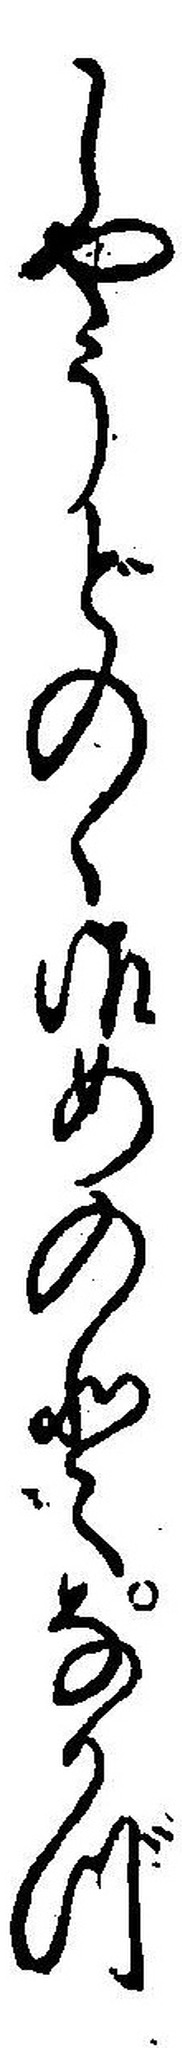しやうどのゝ御めのと。なかづ
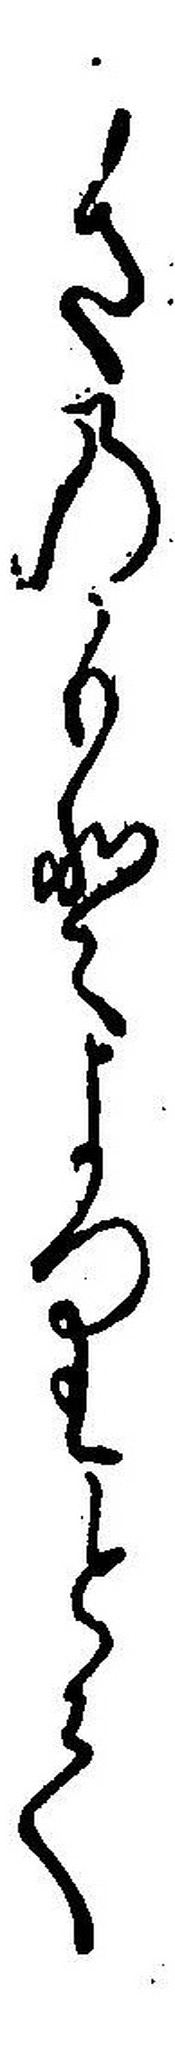かさのもとよりとて
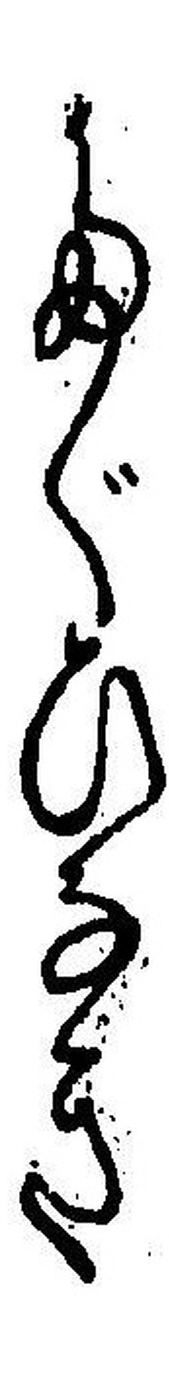たぐひなき
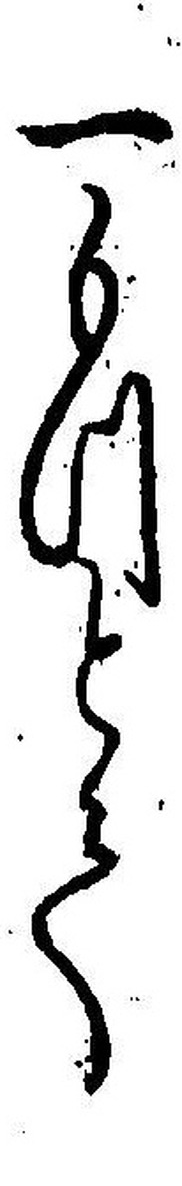一もつとて
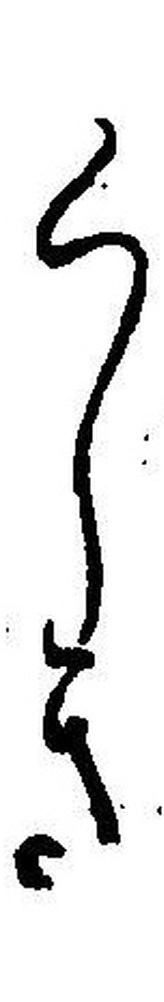くしき
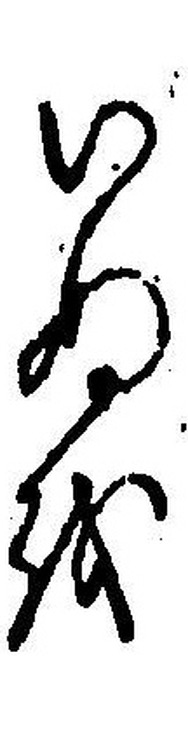いぬを
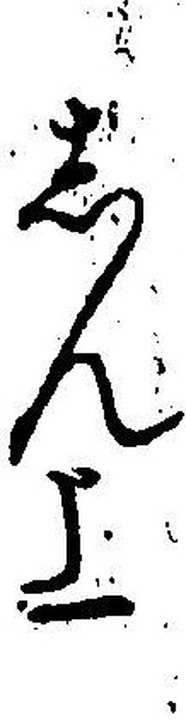しん上
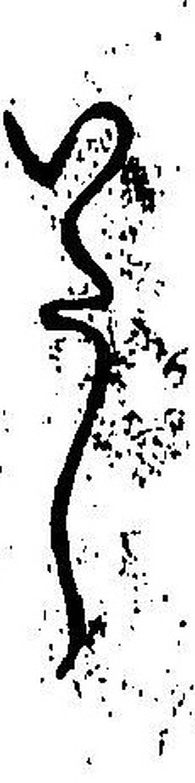いたし

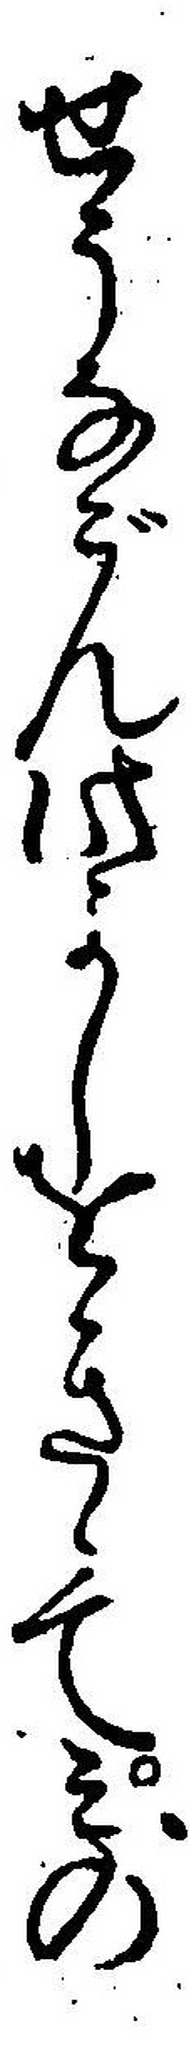せうなごん御よしをきゝて。その
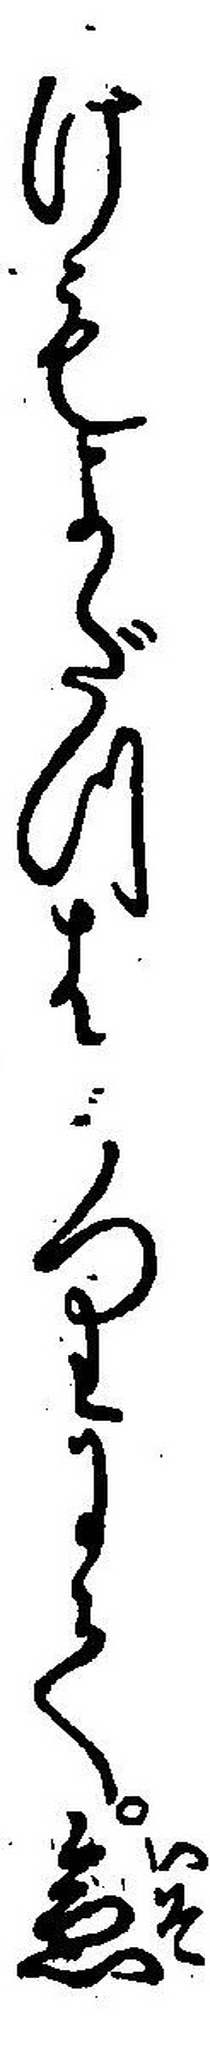けもよだつはかりにて。急
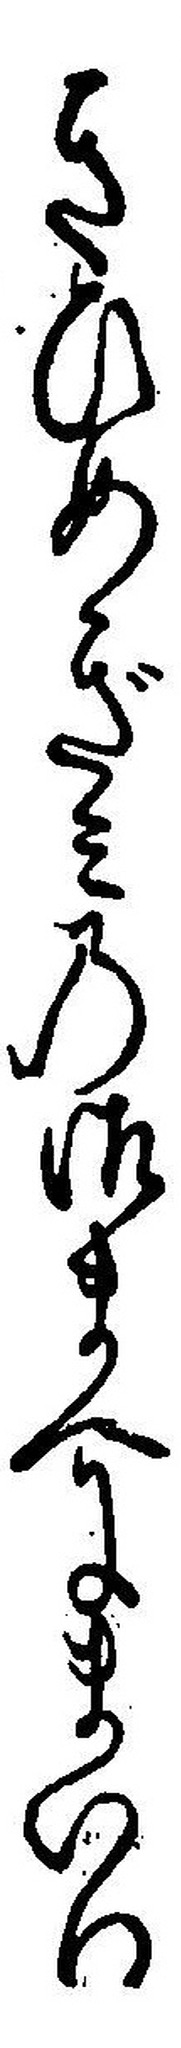きひめぎみの御はへにまいり
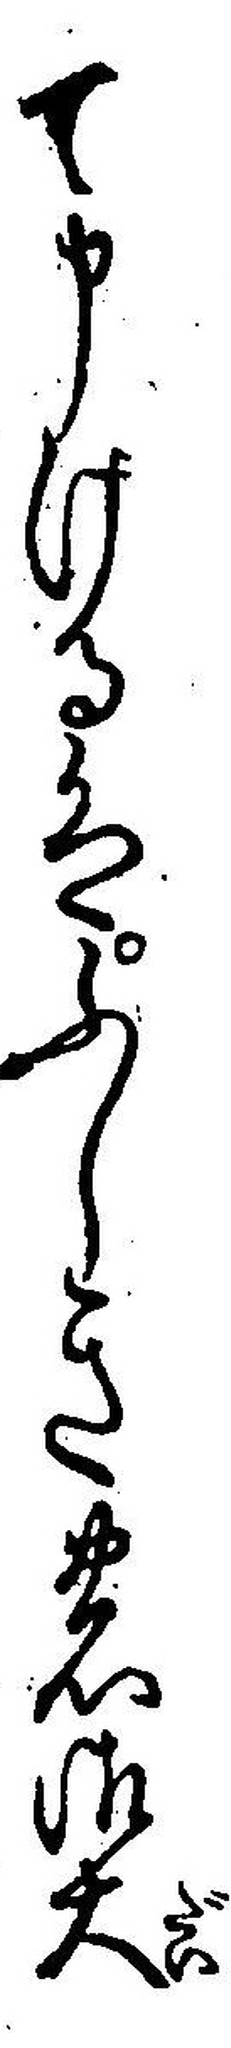て申けるは。ふしきの御大
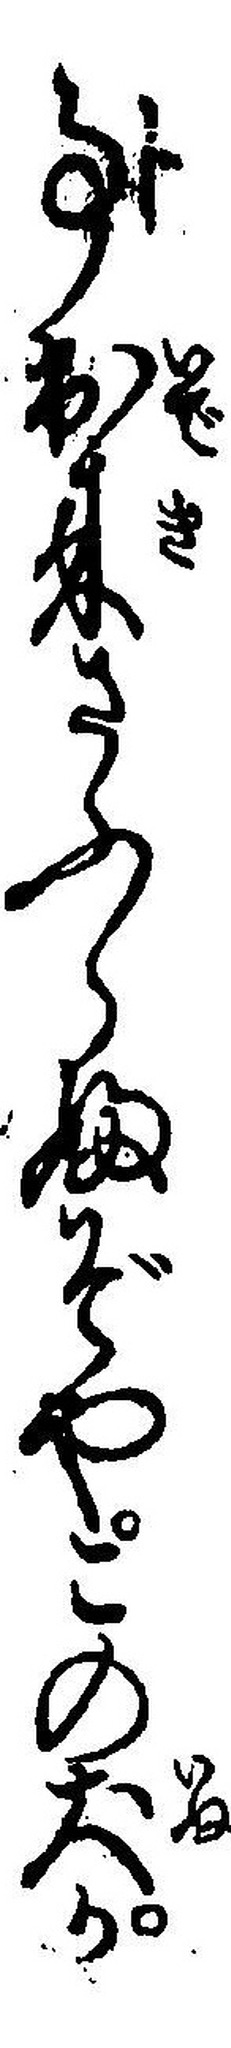事出来さふらふぞや。この犬。か
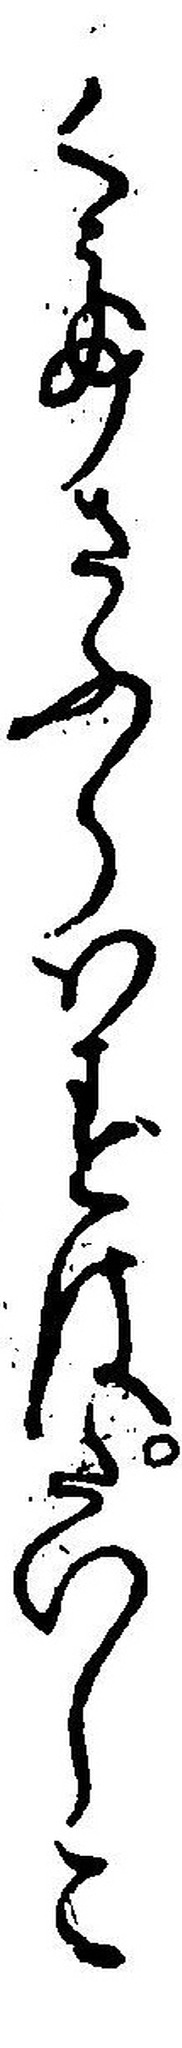くてさふらはずは。たいしこ
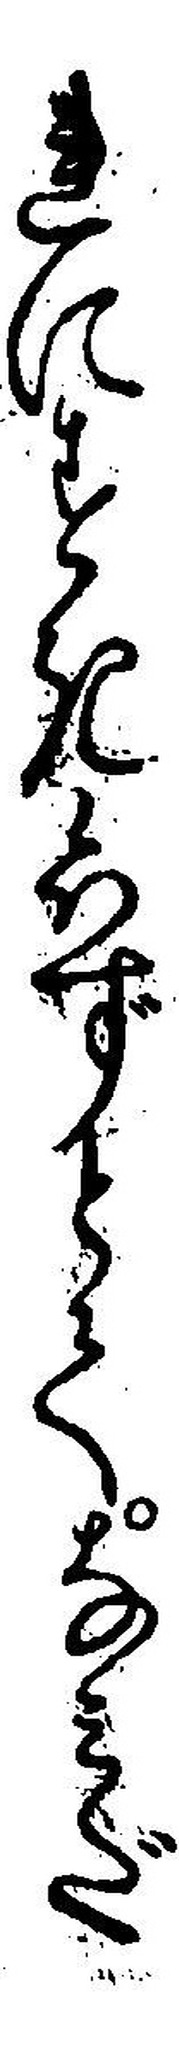れにすき候はずとて。なみだ
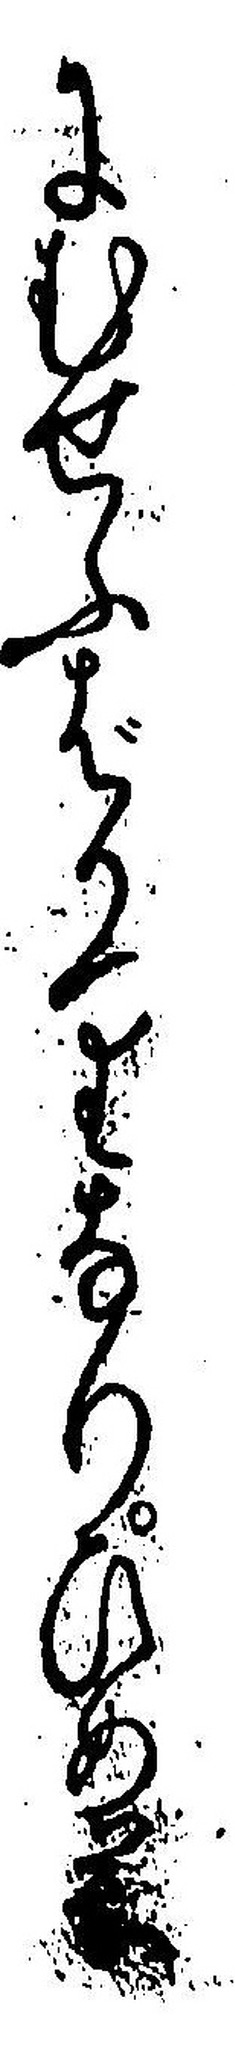にむせふはかりなり。ひめ君
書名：木幡きつね
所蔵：東京大学総合図書館 General Library in the University of Tokyo, JAPAN
